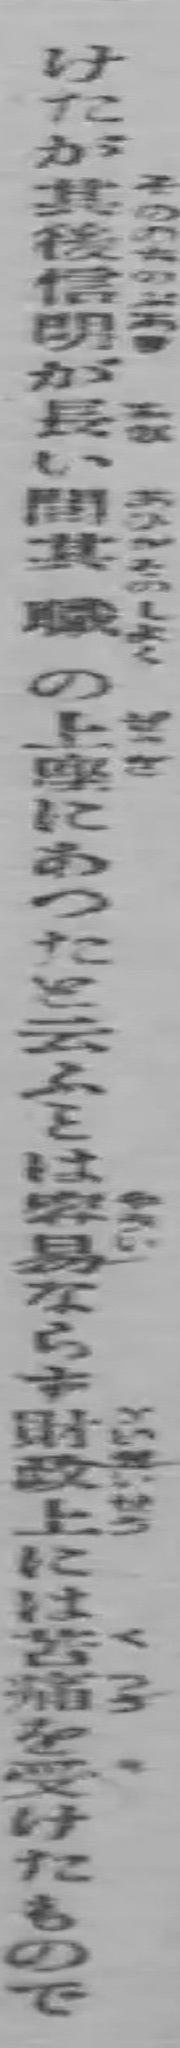けたが其後信明が長い間其職の上座にあつたと云ふことは容易ならず財政上には苦痛を受けたもので
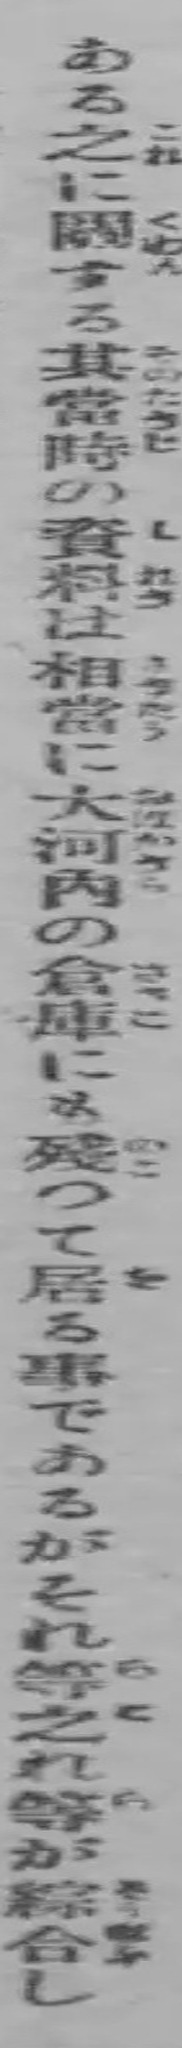ある之に関する其当時の資料は相当に大河内の倉庫にも残つて居る事であるがそれ等が綜合し
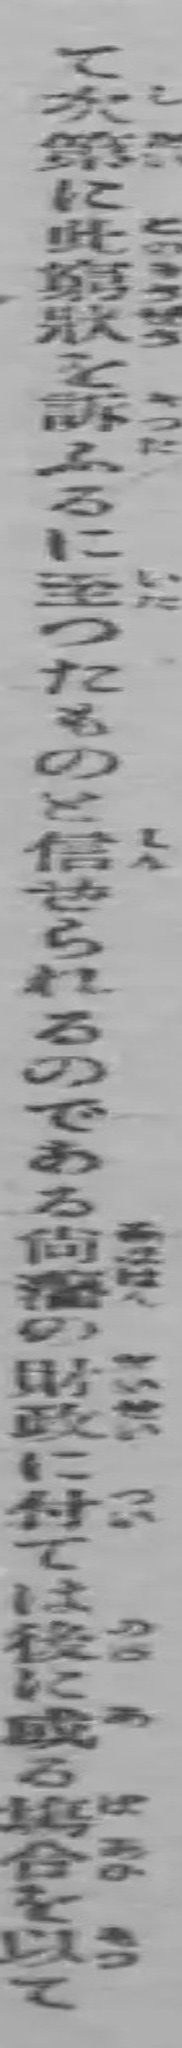て次第に此窮状を訴ふるに至つたものと信ぜられるのである尚藩の財政に付ては後に或る場合を以て
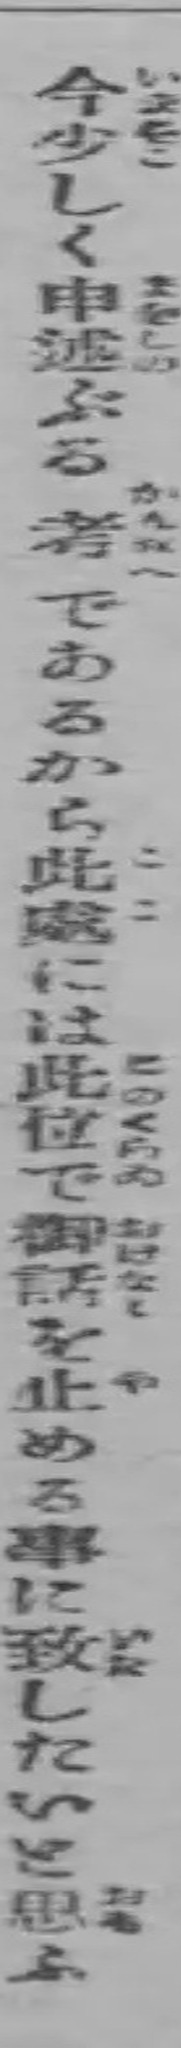今少しく申述ぶる考であるから此処には此位で御話を止める事に致したいと思ふ
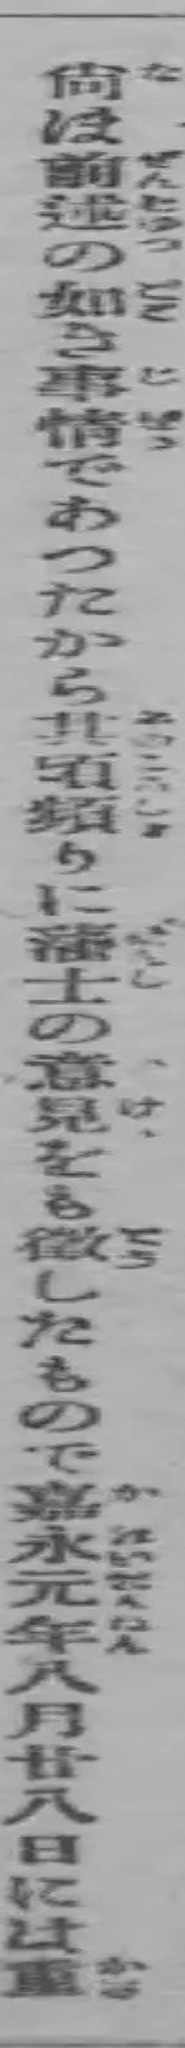尚ほ前述の如き事情であつたから其頃頻りに藩士の意見をも徴したもので嘉永元年八月廿八日には重
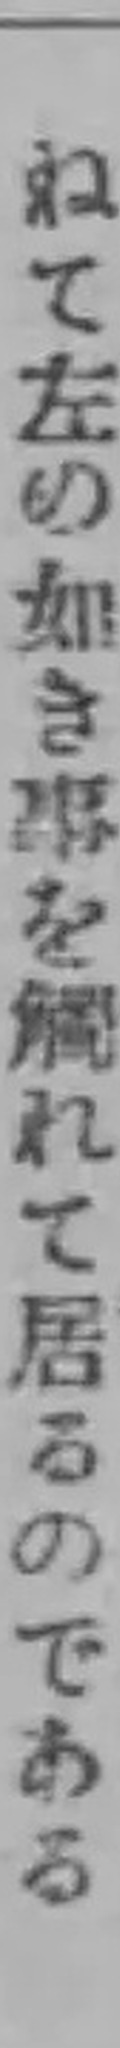ねて左の如き事を觸れて居るのである
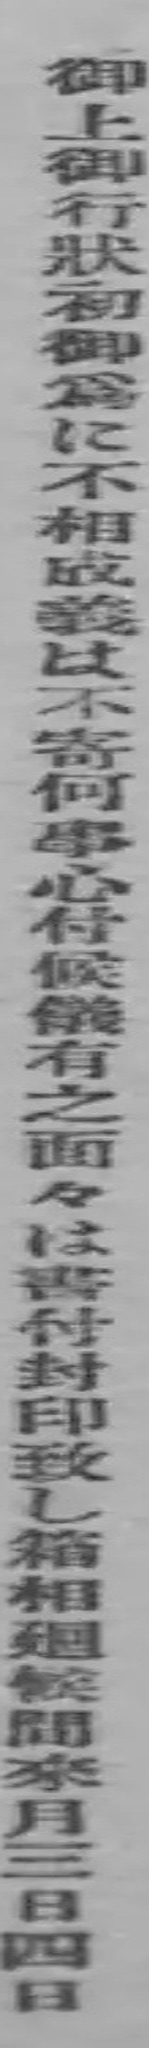御上御行状初御為に不相成義は不寄何事心付候儀有之面々は書付封印致し箱相廻候間来月三日四日
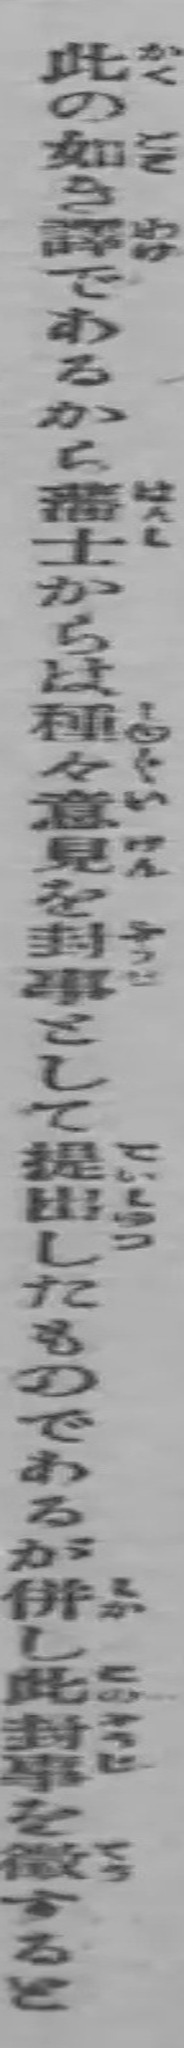封事を徴す此の如き訳であるから藩士からは種々異見を封事として提出したものであるが併し此封事を徴すると
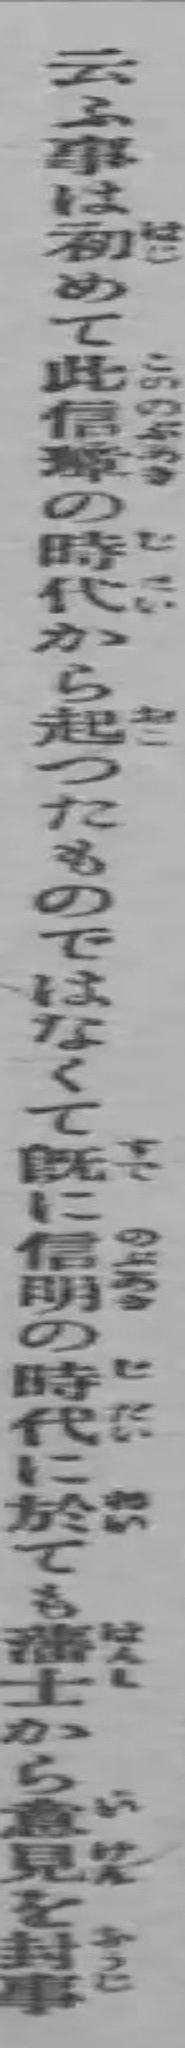云ふ事は初めて此信璋の時代から起つたものではなくて既に信明の時代に於ても藩士から異見を封事
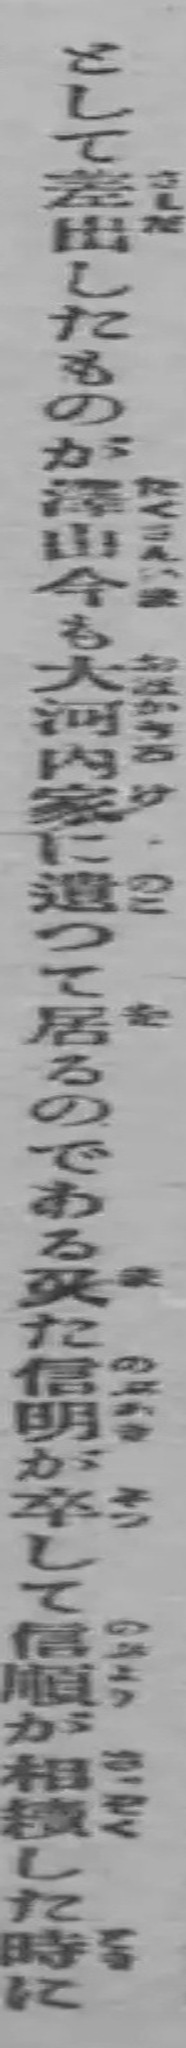として差出したものが沢山今も大河内家に遺つて居るのである又た信明が卒して信順が相続した時に
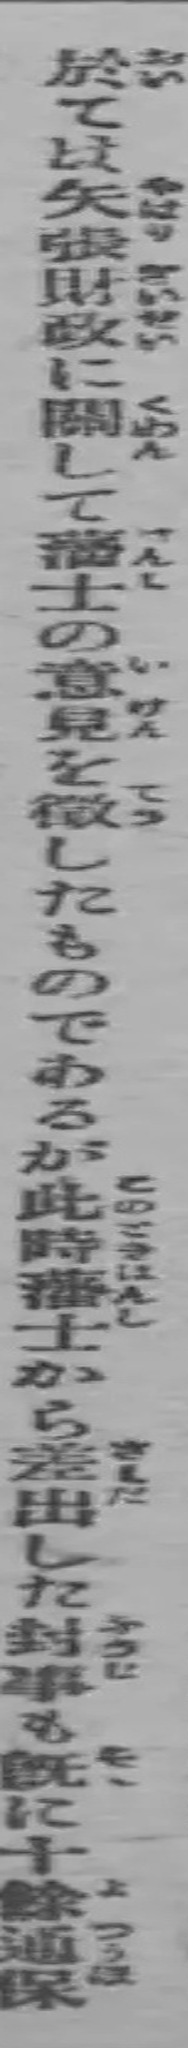於ては矢張財政に関して藩士の意見を徴したものであるが此時藩士から差出した封事も既に十余通保
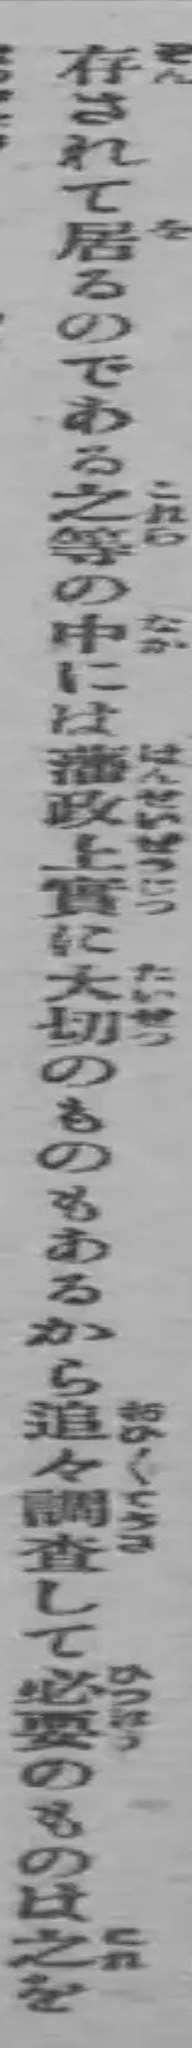存されて居るのである之等の中には藩政上実に大切のものもあるから追々調査して必要のものは之を
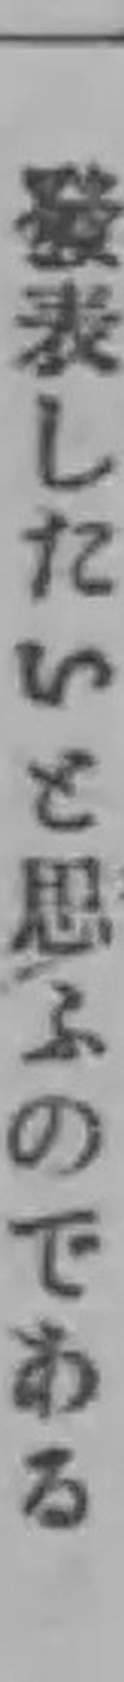発表したいと思ふのである
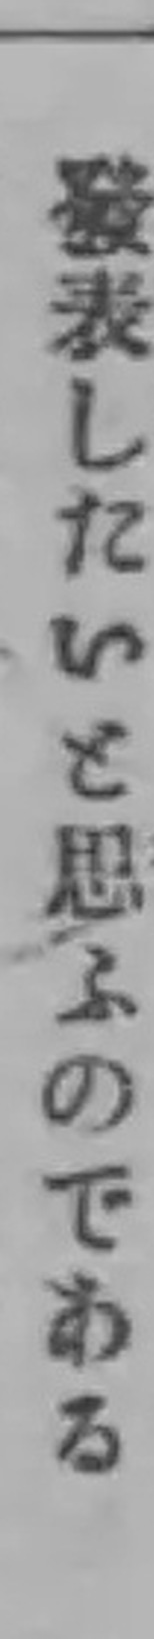発表したいと思ふのである
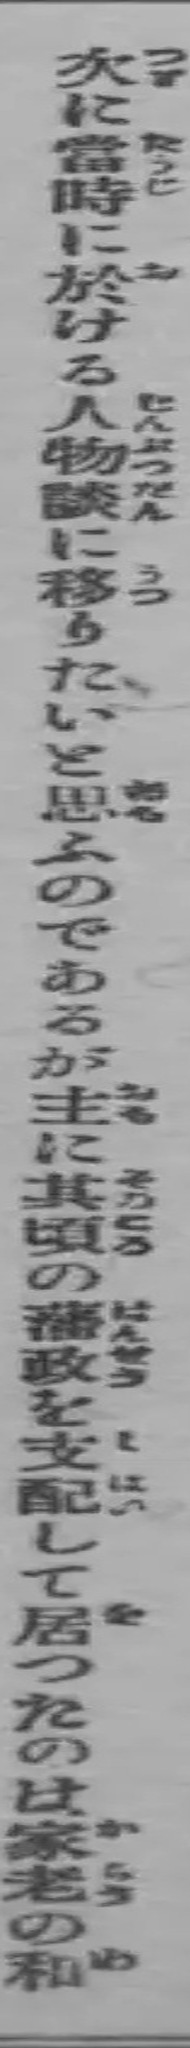次に当時に於ける人物談に移りたいと思ふのであるが主に其頃の藩政を支配して居つたのは家老の和
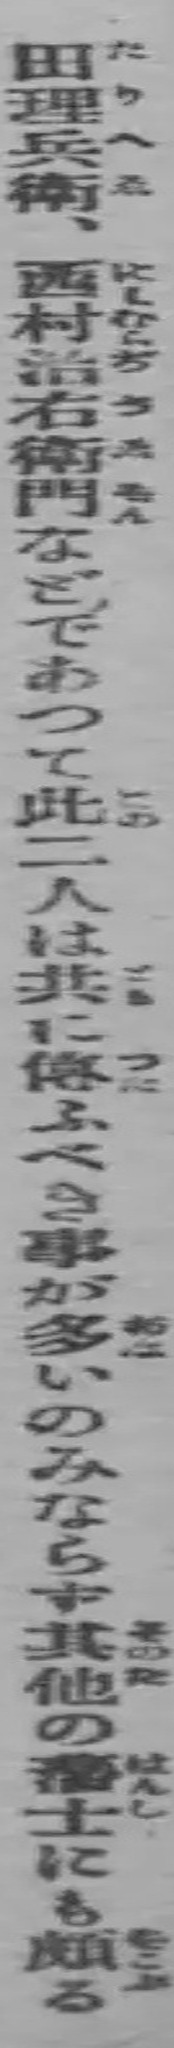田理兵衛、西村治右衛門などであつて此二人は共に伝ふべき事が多いのみならず其他の藩士にも頗る
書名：豊橋市史談
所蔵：国立国会図書館 National Diet Library, JAPAN
